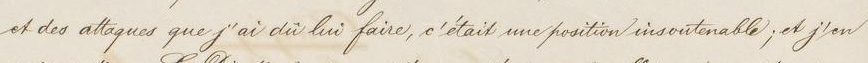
et des attaques que j'ai dû lui faire, c'était une position insoutenable; et j'en
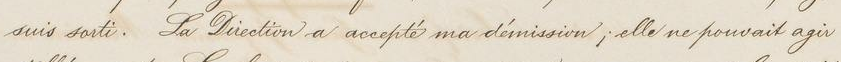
suis sorti. La Direction a accepté ma démission; elle ne pouvait agir
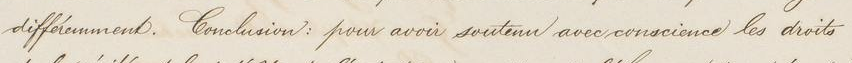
différemment. Conclusion: pour avoir soutenu avec conscience les droits
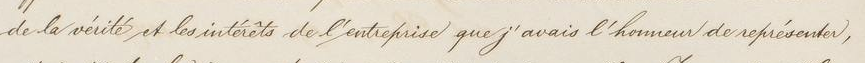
de la vérité et les intérêts de l'entreprise que j'avais l'honneur de représenter,
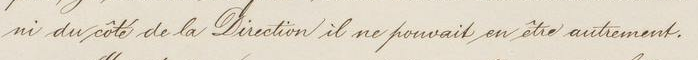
ni du côté de la Direction il ne pouvait en être autrement.
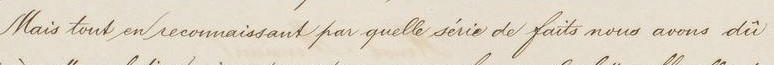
Mais tout en reconnaissant par quelle série de faits nous avons dû
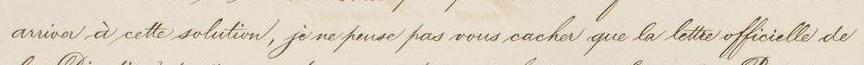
arriver à cette solution, je ne pense pas vous cacher que la lettre officielle de
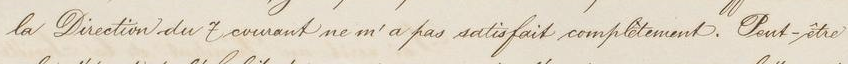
la Direction du 7 courant ne m'a pas satisfait complètement. Peut-être
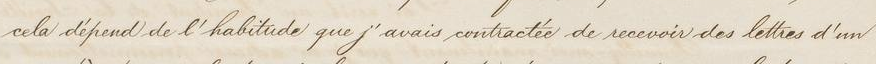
cela dépend de l'habitude que j'avais contractée de recevoir des lettres d'un
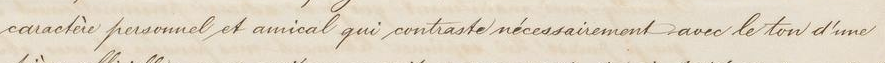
caractère personnel et amical qui contracte nécessairement avec le ton d'une
